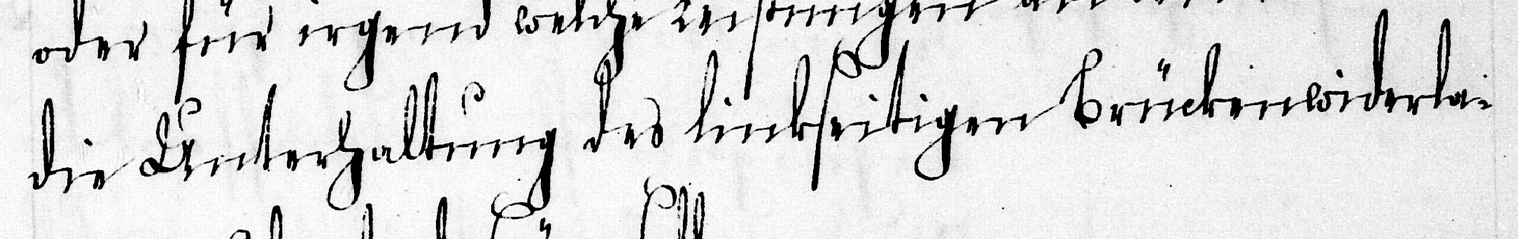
die Unterhaltung des linkseitigen Brückenwiderla¬
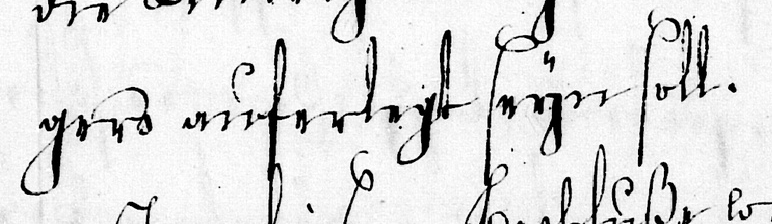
gers auferlegt seyn soll.
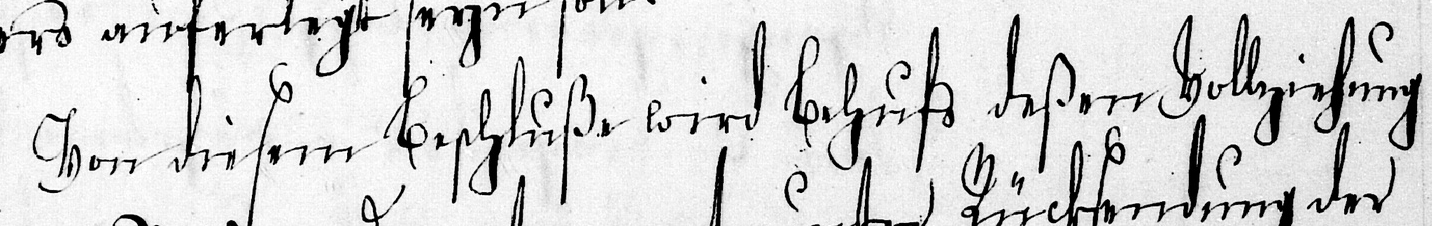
Von diesem Beschluße wird Behufs deßen Vollziehu¬
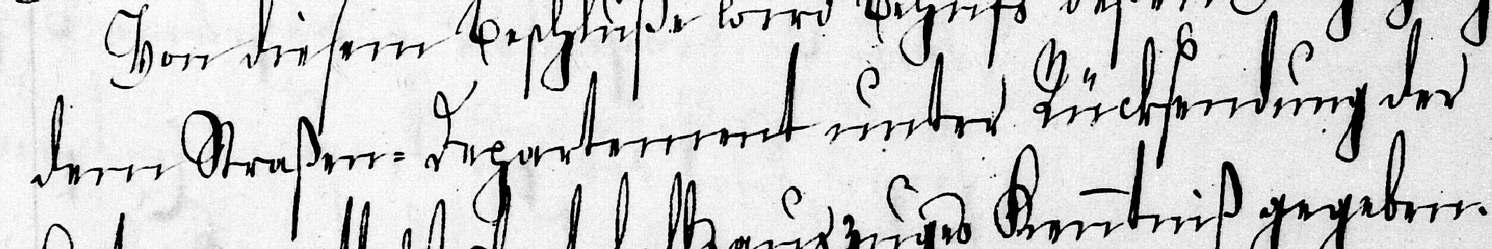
dem Straßen-Departement unter Rücksendung der
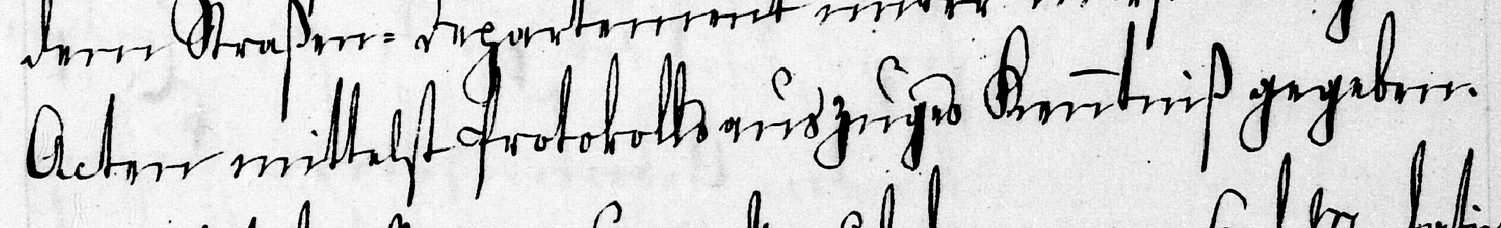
Acten mittelst Protokollsauszuges Kenntniß gegeben.
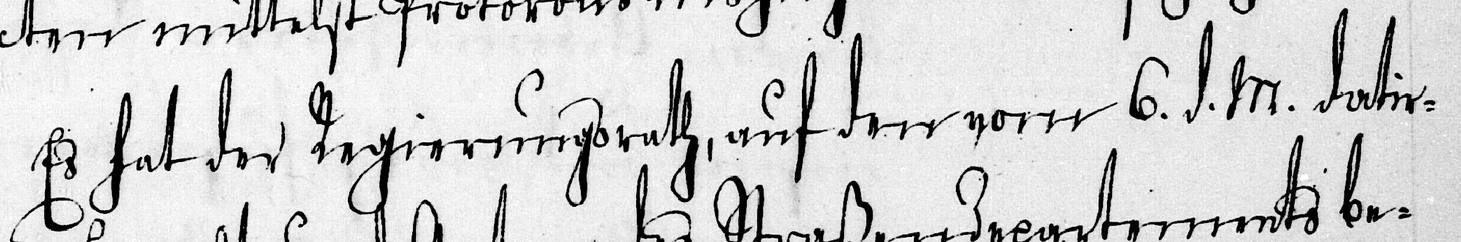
Es hat der Regierungsrath, auf den vom 6. d. M. datir¬
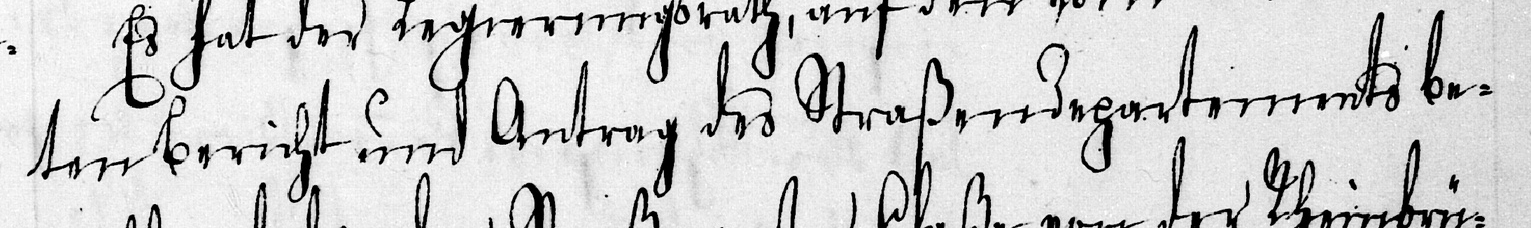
ten Bericht und Antrag des Straßendepartements be¬
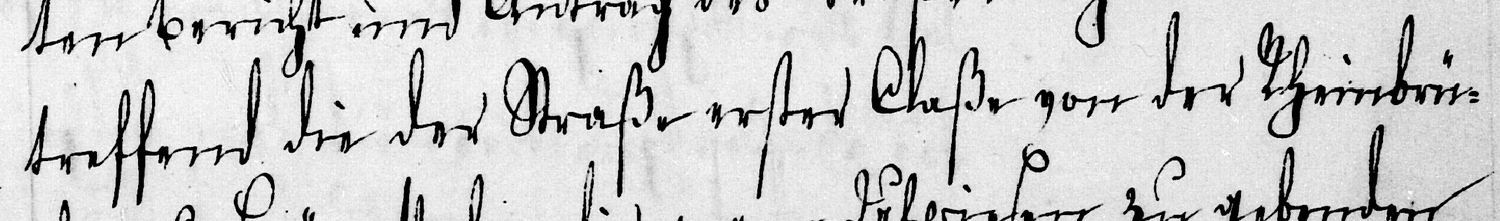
treffend die der Straße erster Claße von der Rheinbrü¬
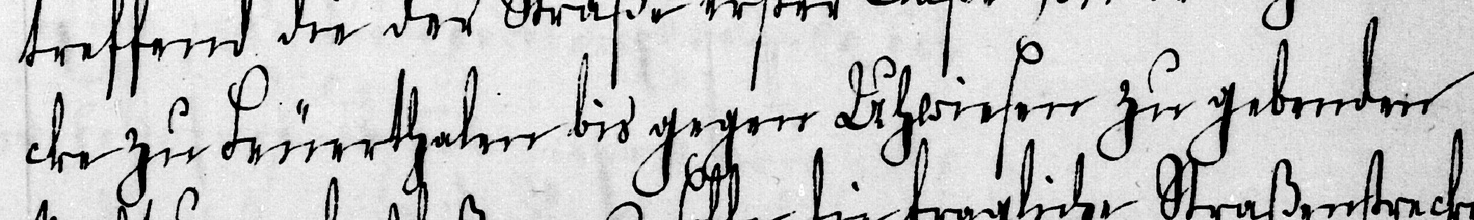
cke zu Feuerthalen bis gegen Uhwiesen zu gebenden
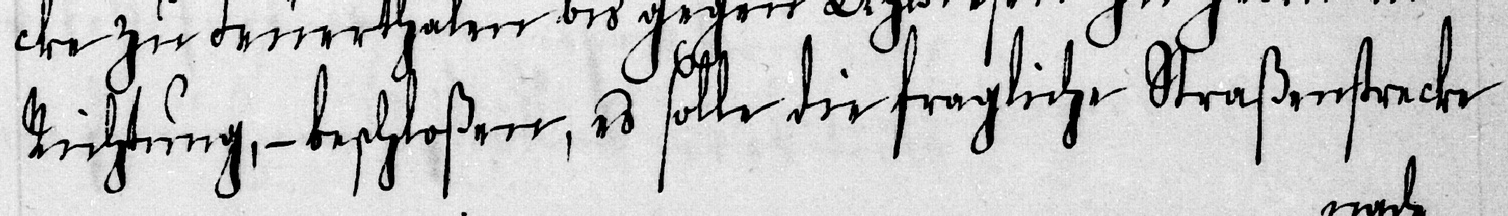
Richtung, – beschloßen, es solle die fragliche Straßenstrecke
